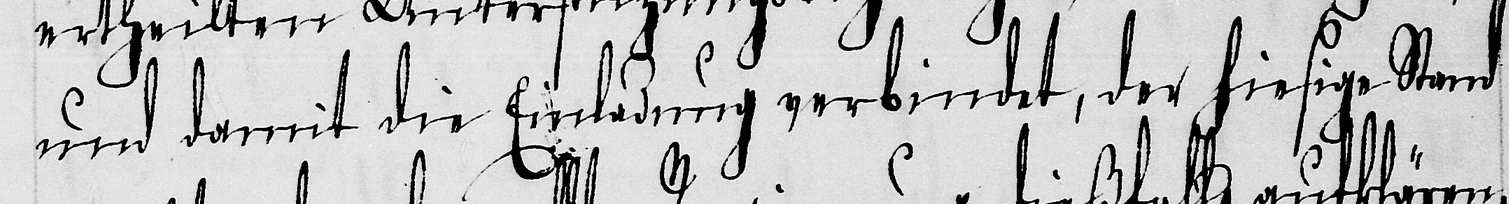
und damit die Einladung verbindet, der hiesige Stand
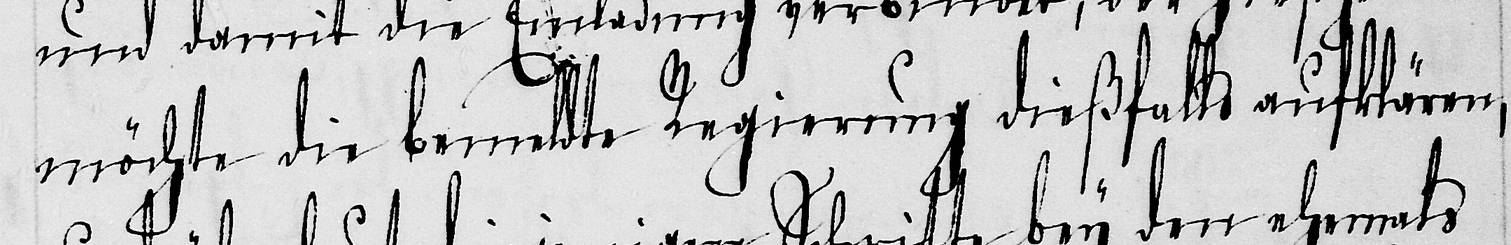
möchte die bemeldte Regierung dießfalls aufkläre¬
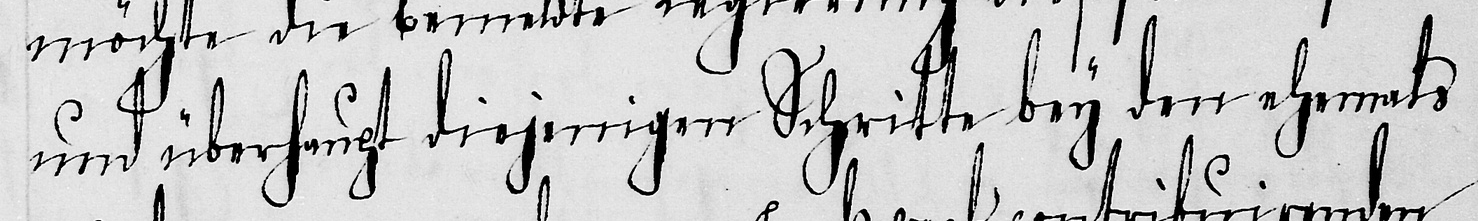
und überhaupt diejenigen Schritte bey den ehemals
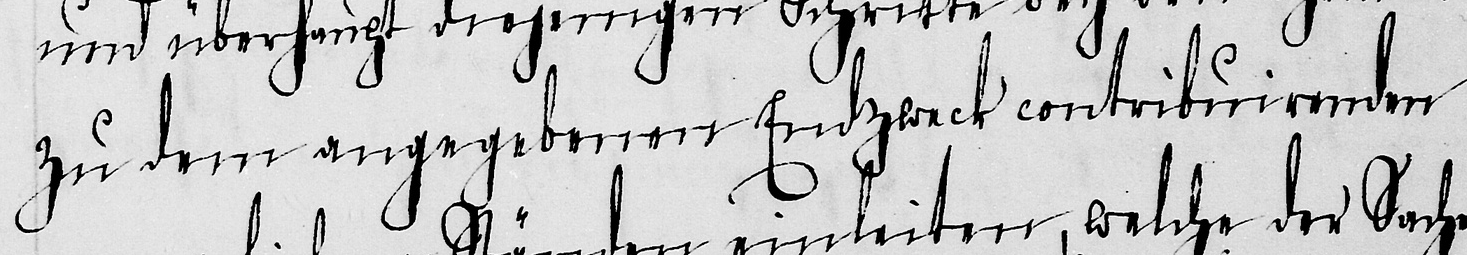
zu dem angegebenen Endzweck contribuirenden
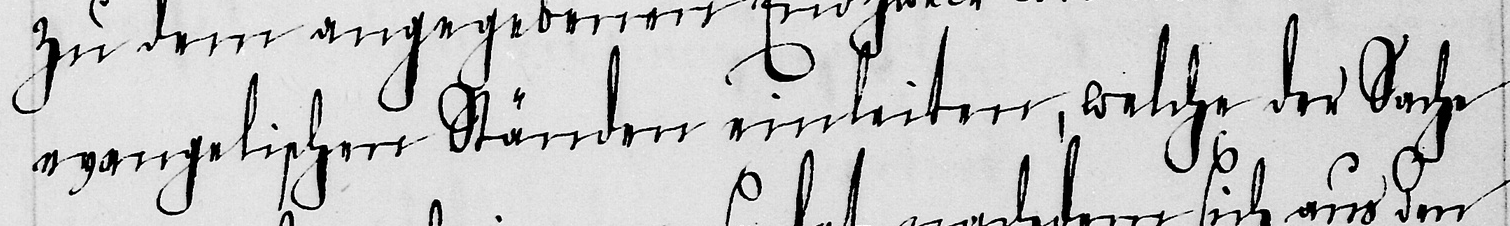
evangelischen Ständen einleiten, welche der Sache
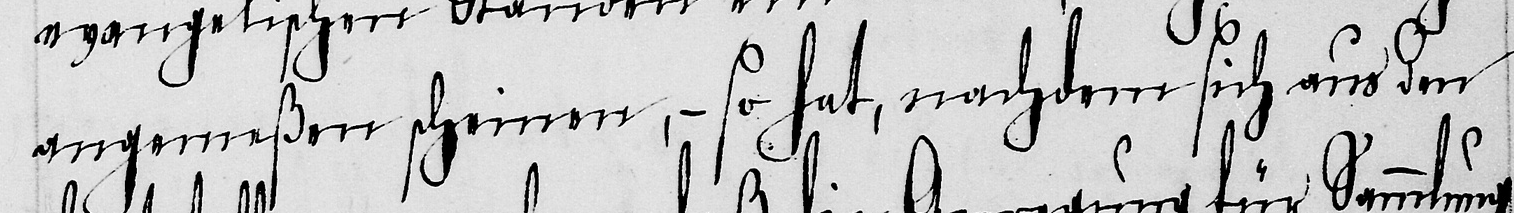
angemeßen scheinen, – so hat, nachdem sich aus den
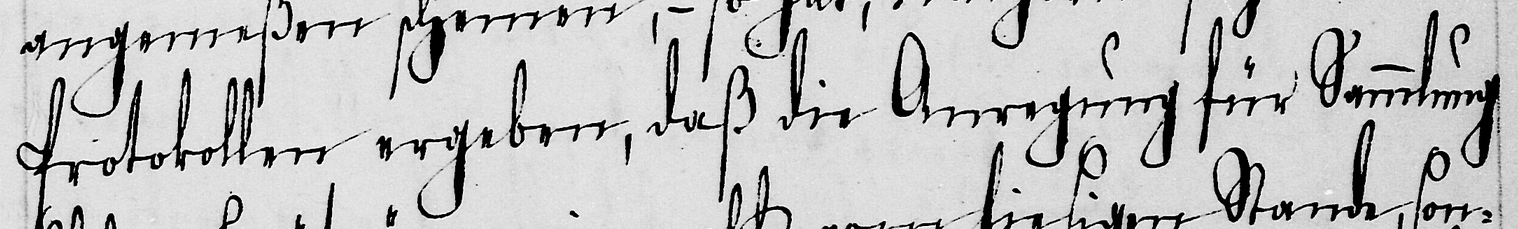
Protokollen ergeben, daß die Anregung für Sammlung
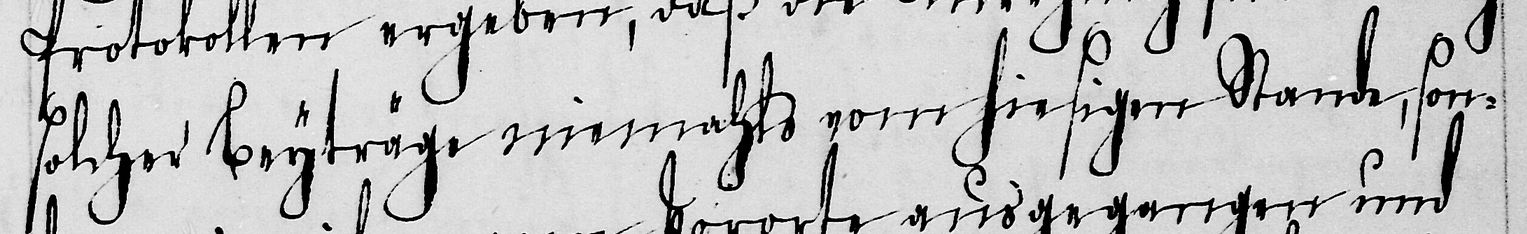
solcher Beyträge niemahls vom hiesigen Stande, son¬
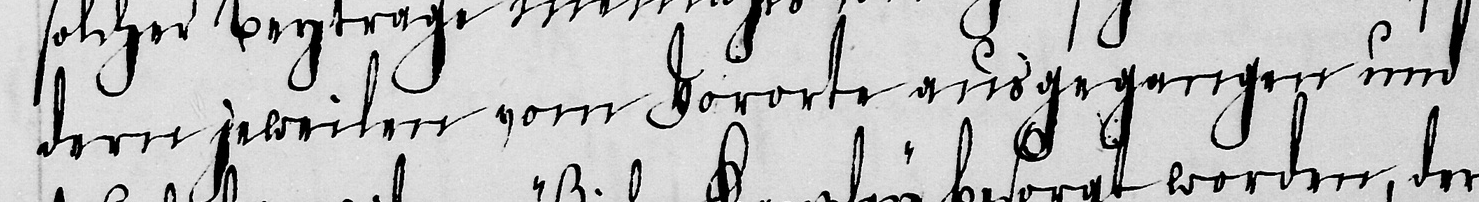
dern jeweilen vom Vororte ausgegangen und
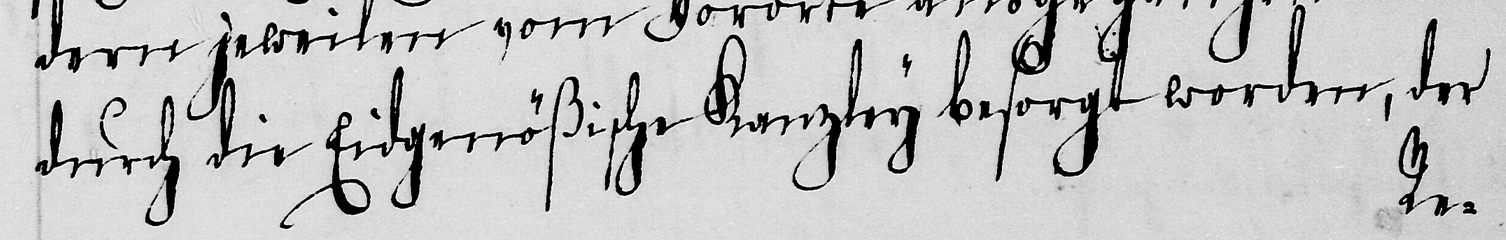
durch die Eidgenößische Kanzley besorgt werde, der
